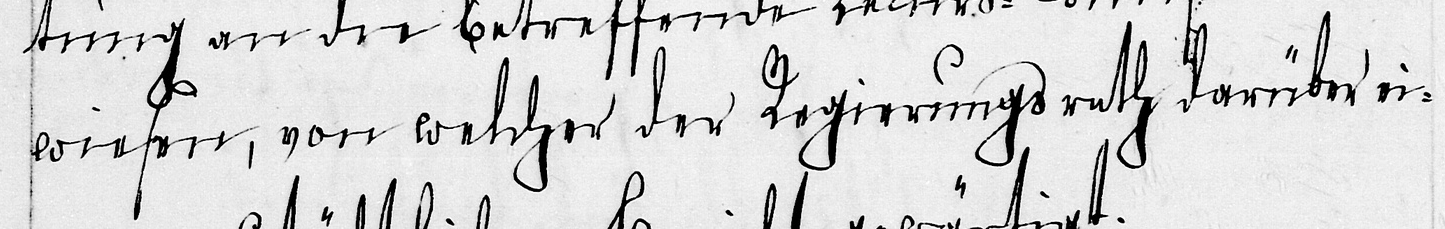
wiesen, von welcher der Regierungsrath darüber ei¬
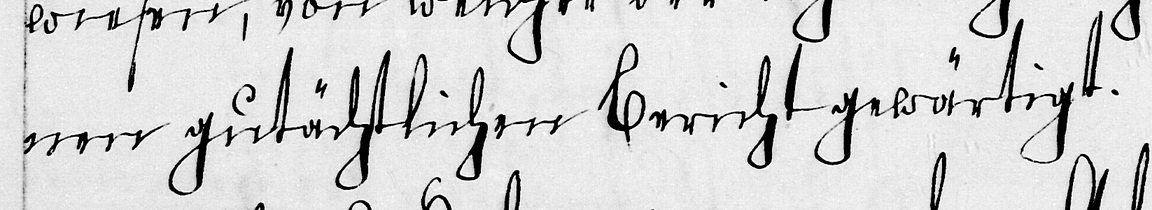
nen gutächtlichen Bericht gewärtigt.
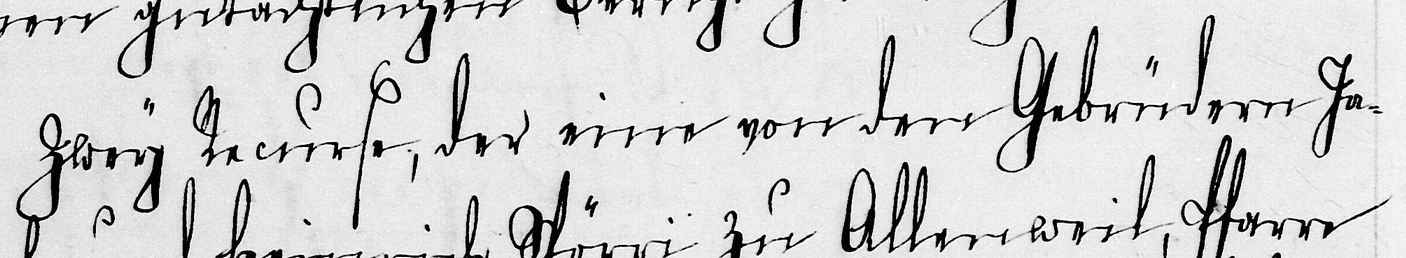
Zwey Recurse, der eine von den Gebrüdern Ja¬
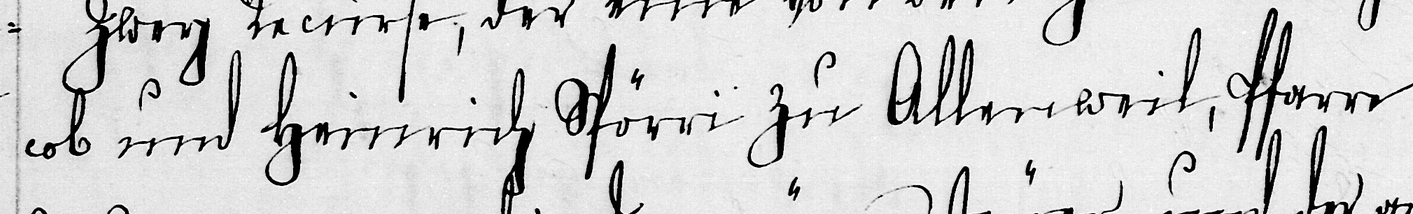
cob und Heinrich Spörri zu Allenweil, Pfarre
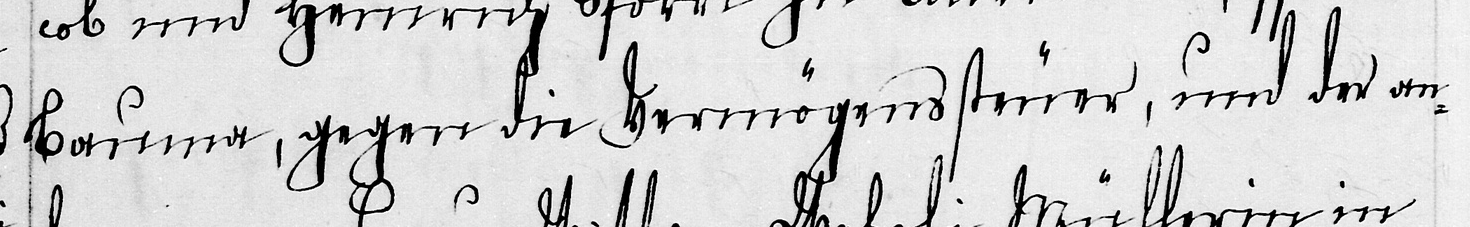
Bauma, gegen die Vermögenssteuer, und der an¬
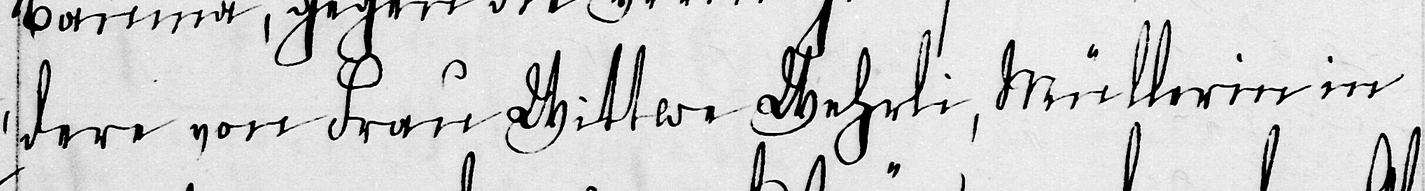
dere von Frau Wittwe Wehrli, Müllerin in
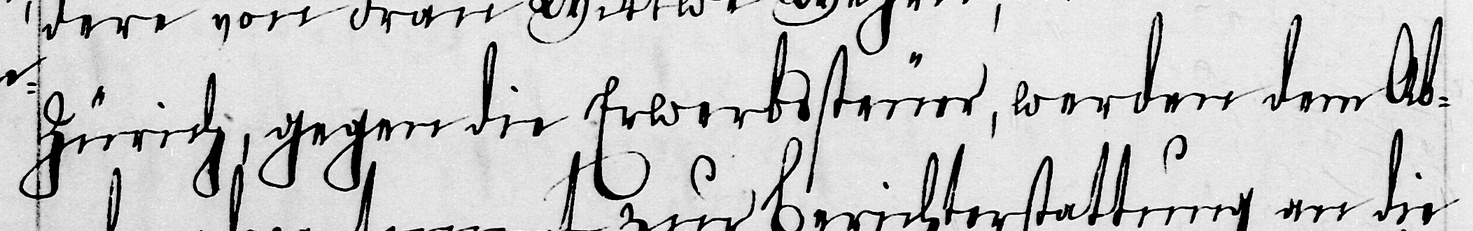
Zürich, gegen die Erwerbssteuer, werden dem Ab¬
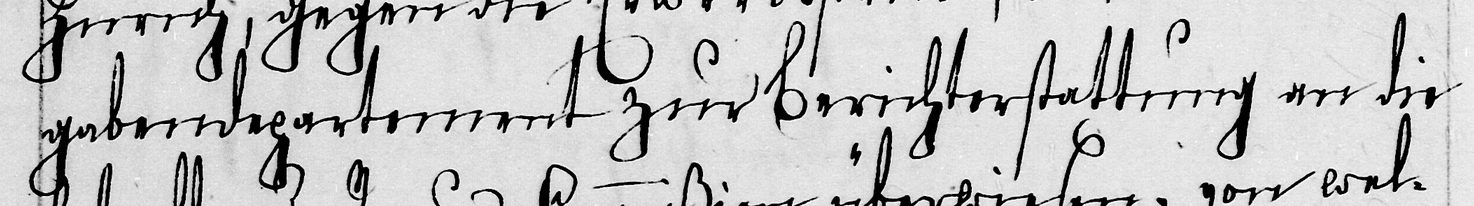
gabendepartement zur Berichterstattung an die
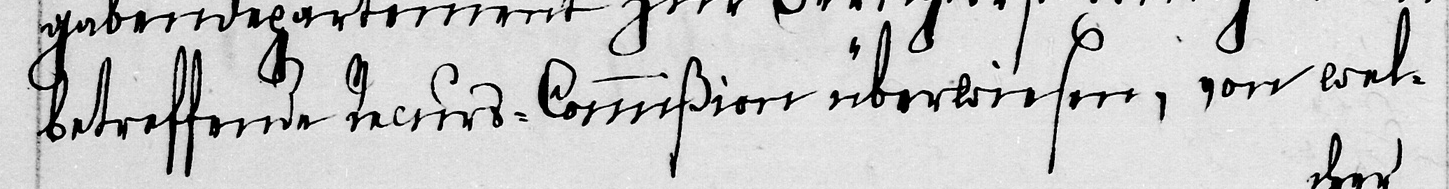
betreffende Recurs-Commißion überwiesen, von wel-
